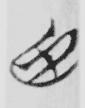臣
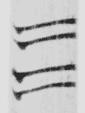亖
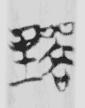{里吅吝}
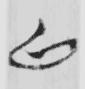㠯（以）
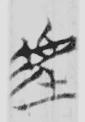𫊟
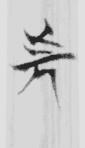先
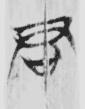君
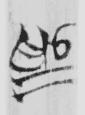爲
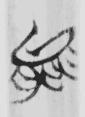能
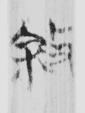敘
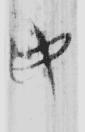女
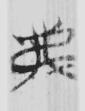弗
